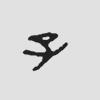子
